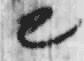巳
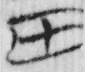甲
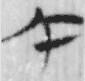午
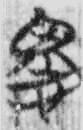愄（威）
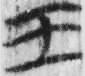王
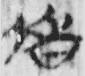俈
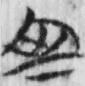室
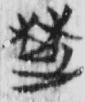楚
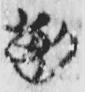○（斷）
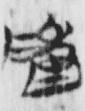○（陳）
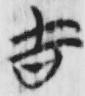吉
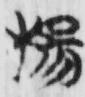楊
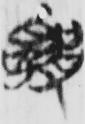亂
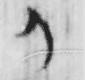人
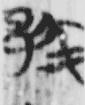○（蔡）
